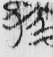蔡
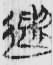○（遺）
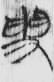受
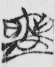○（鑄）
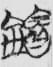鐱（劍）
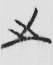之
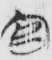官
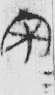宋宋
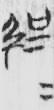強強
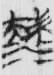灋
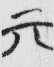亓（其）
